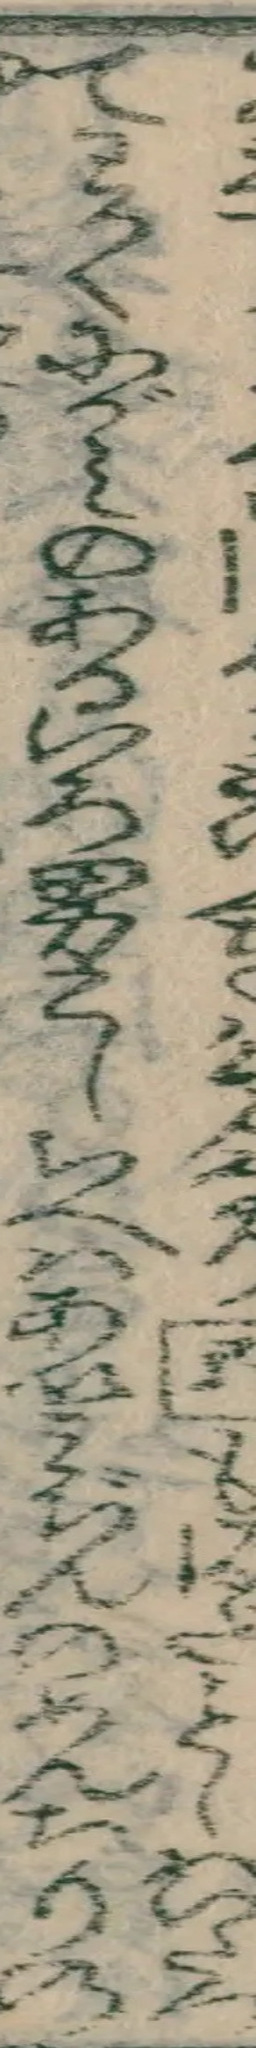てわかくにがみのあるいろ男こしらへはあいみぢんのめんちりの
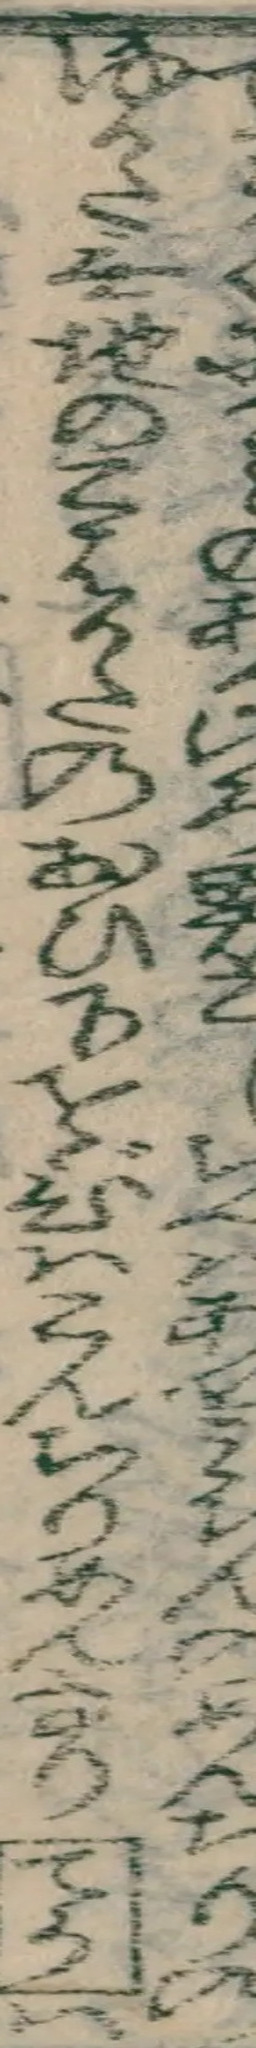ゆかた無地のこはかたのおひ下をびはこんちりめんなり〈てう〉は
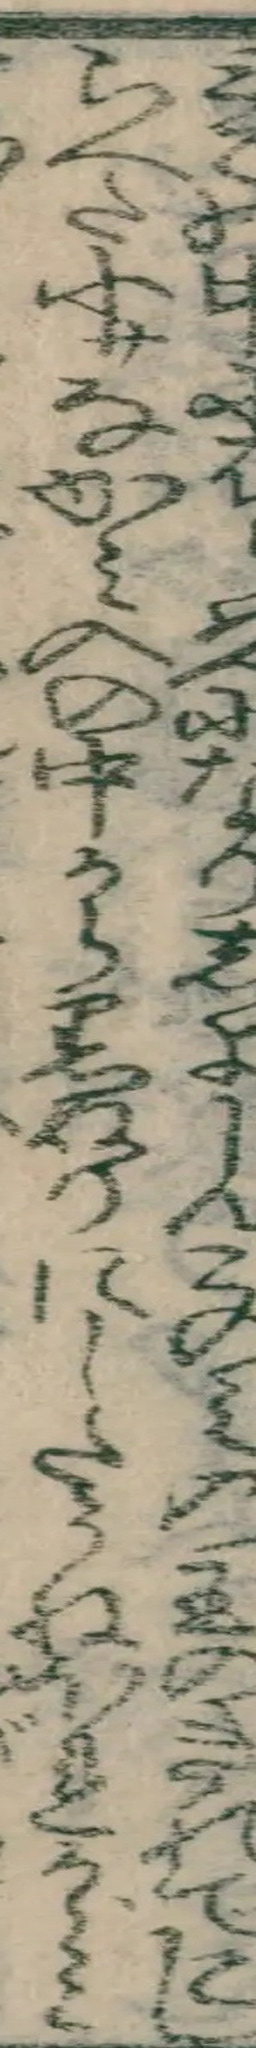らへた小さなかみ入の中から黒ぬりにしたうぬほれかゞみ
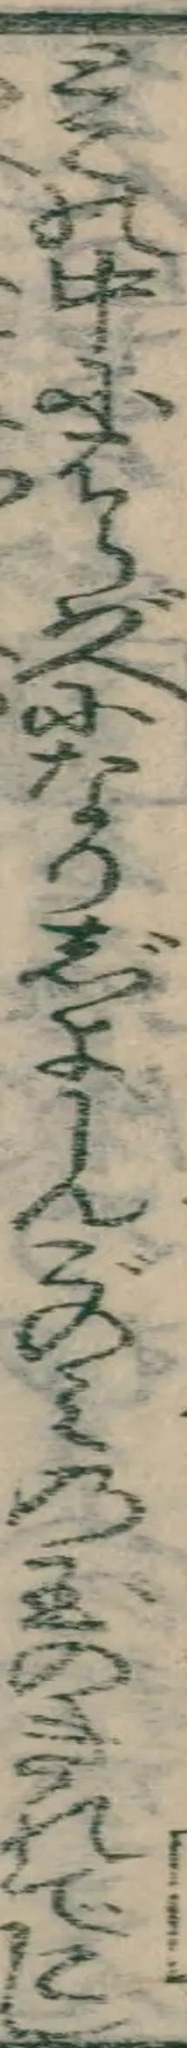とこの中にはらばへになりじよしんごのみの玉のきれてこし
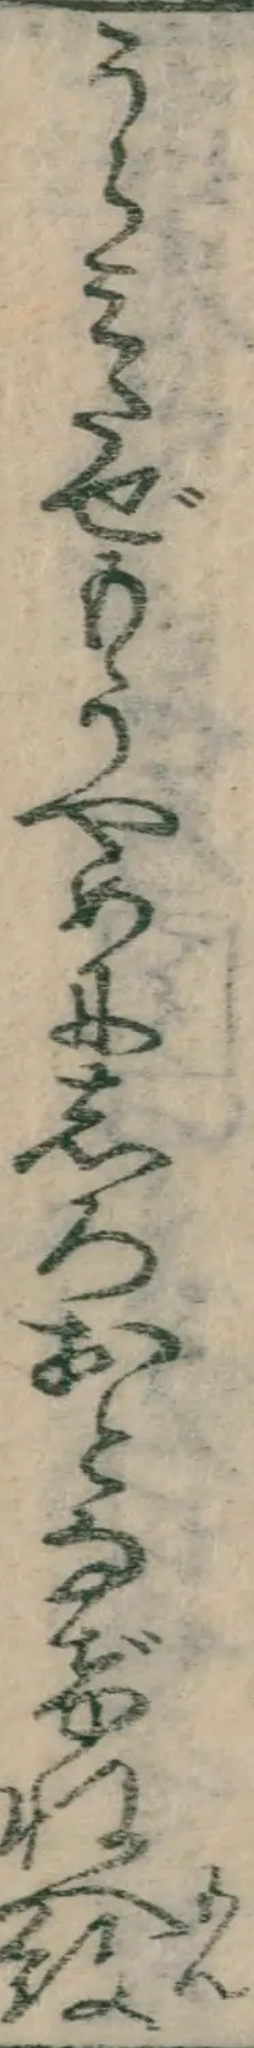うらみたぜもうやめにしろおとなげねへ紋

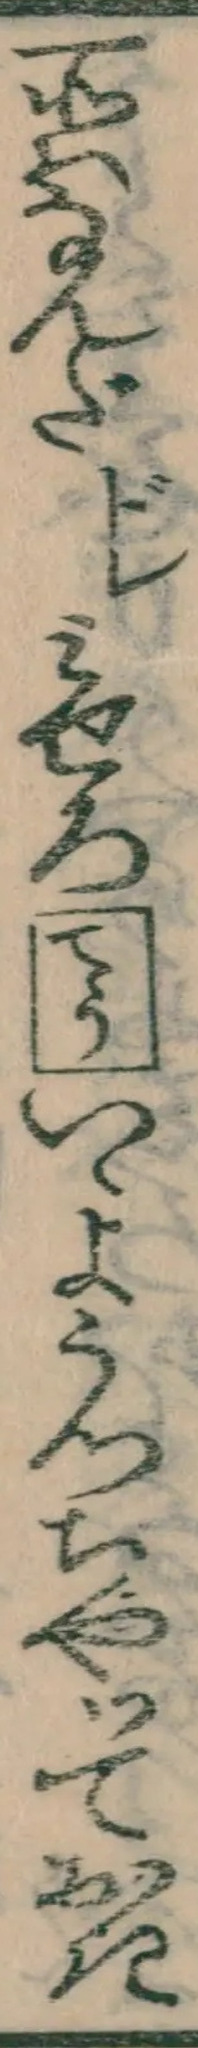所はなんだドレみせろ〈てう〉いゝようつちやつちやつておき
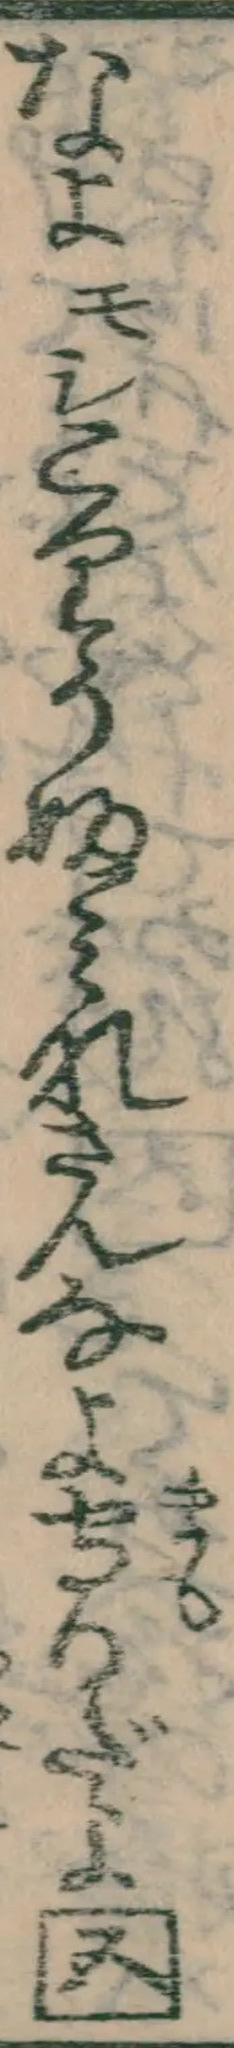なよモシもこりうふみなさんなよ守りだよ〈五〉
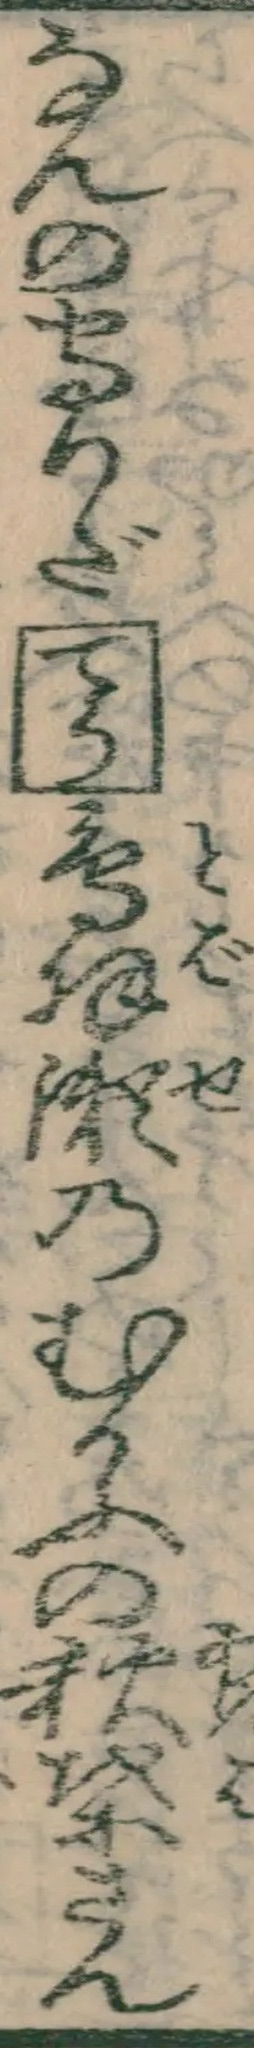なんの守りだ〈てう〉鳥羽瀬のむかふの秋葉さん
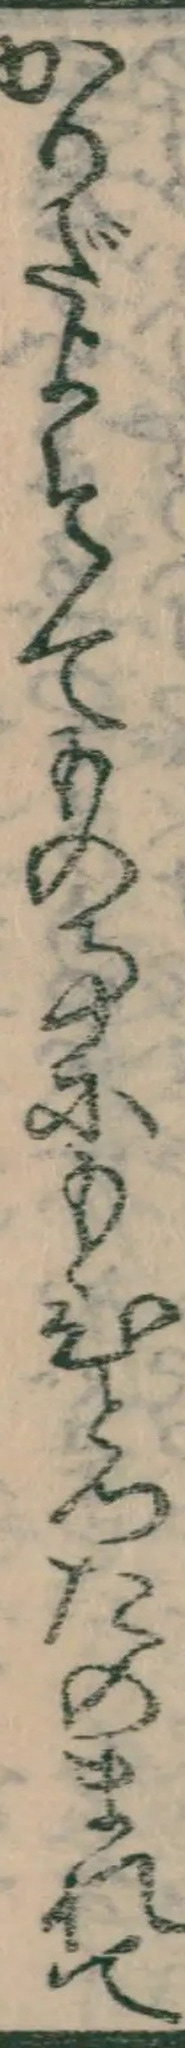かりだよとてもの事にもひとつたのまれて
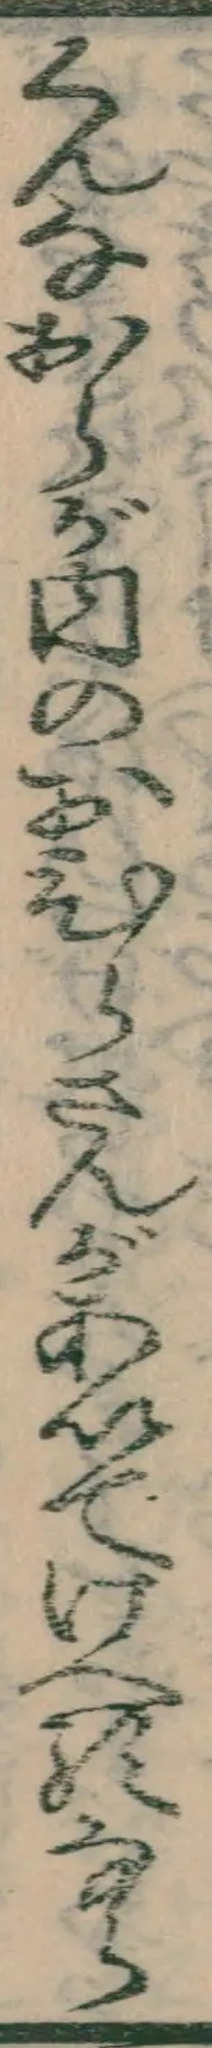くんなおらが内のおひらさんがあいでけへるなら
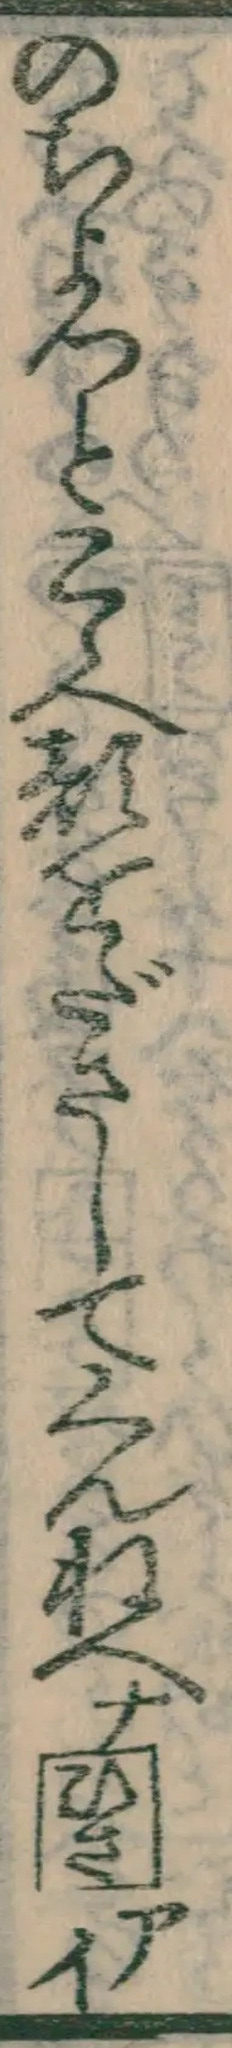のちよつとこゝへ顔をださしてくんねへナ〈ひさ〉アイ
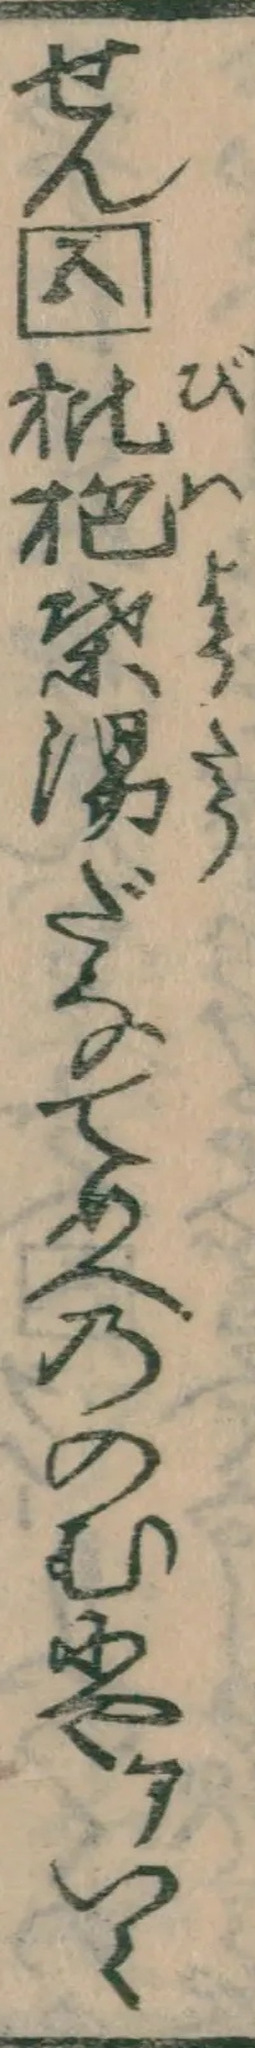せん〈五〉枇杷葉湯だなてめへののむにやァいゝ
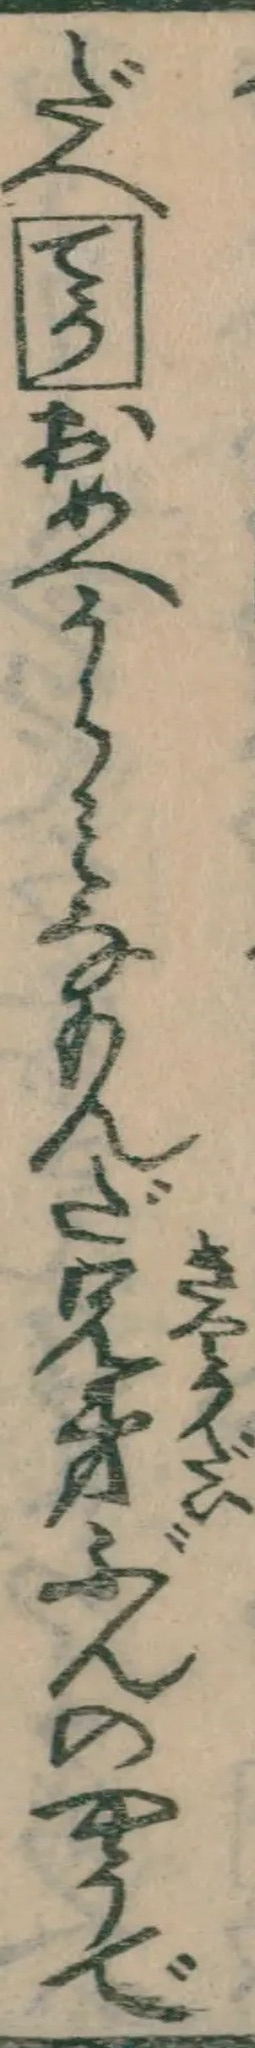だへ〈てう〉おめへうらみなもんだ兄弟ぶんのやうで
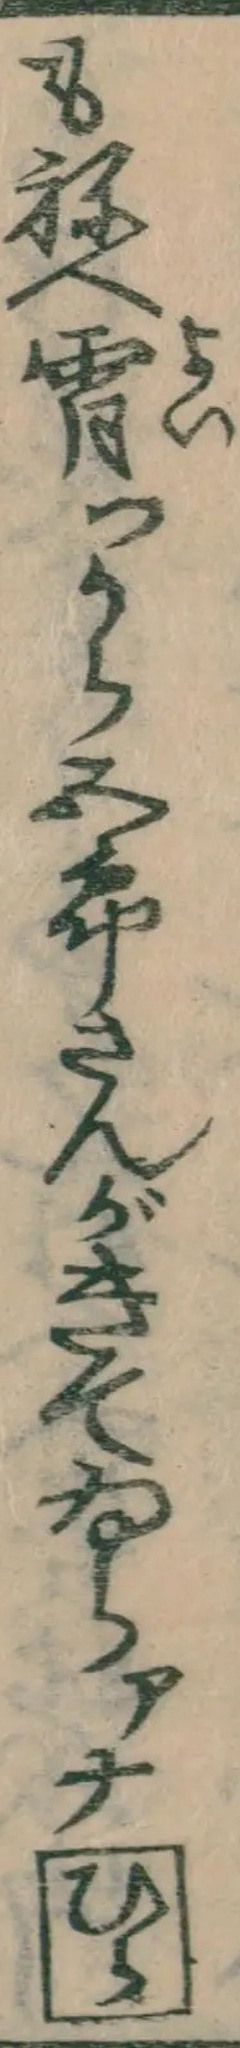もねへ宵つから五郎さんがきてゐらアナ〈ひら〉
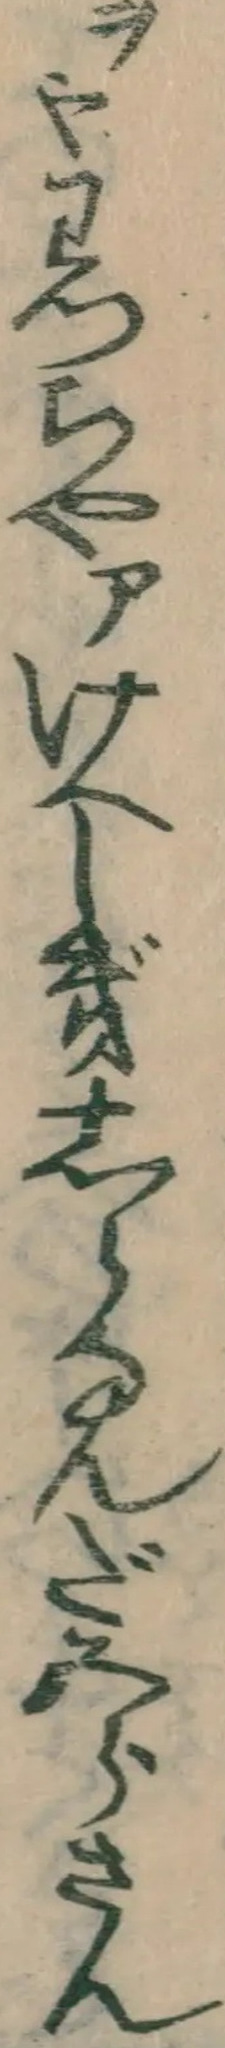オヤわつちやァけへしぎしらなんだ五郎さん
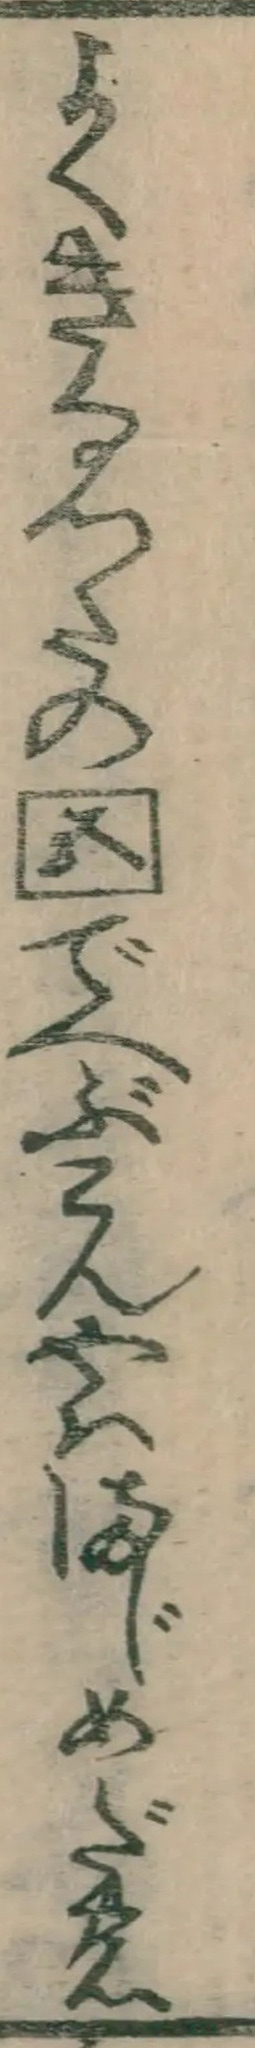よくきなつたの〈五〉でへぶこんやはまじめだの
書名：教訓読本：大礒風俗仕懸文庫
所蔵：国立国会図書館 National Diet Library, JAPAN
